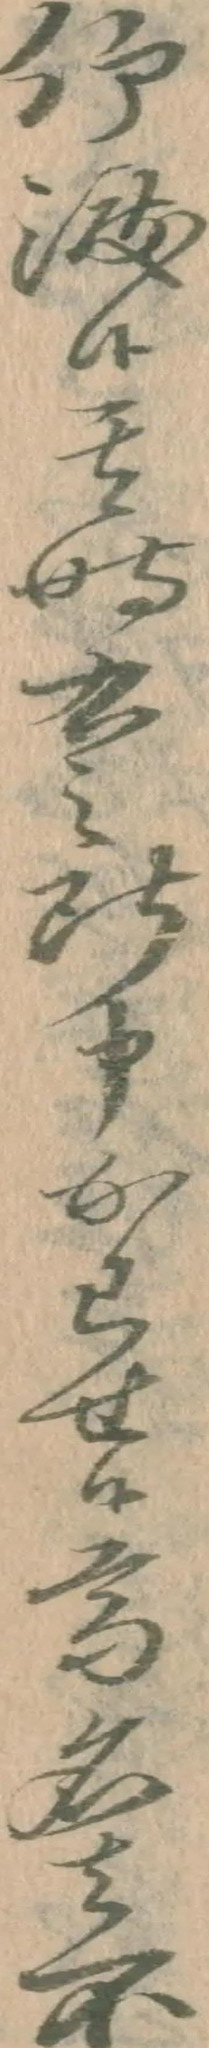仰渡候其時右之断申か已せ候高名者不
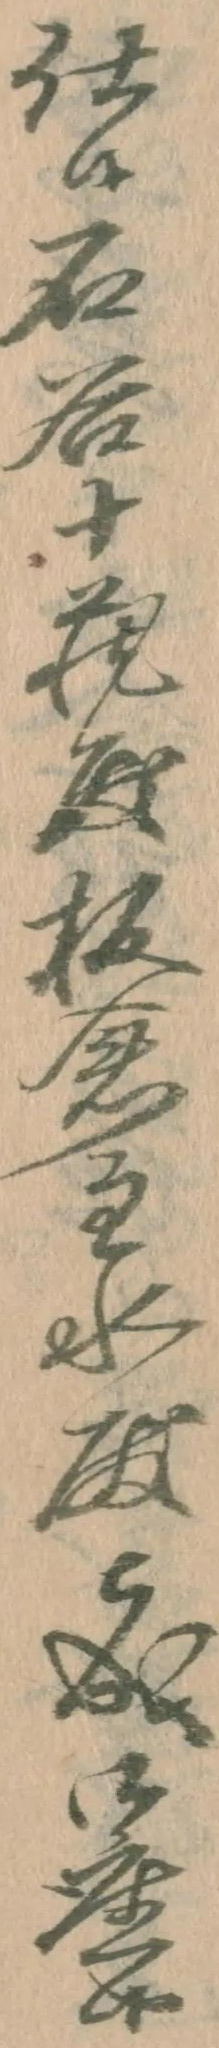仕候石谷十蔵殿板倉主水殿被成御座候
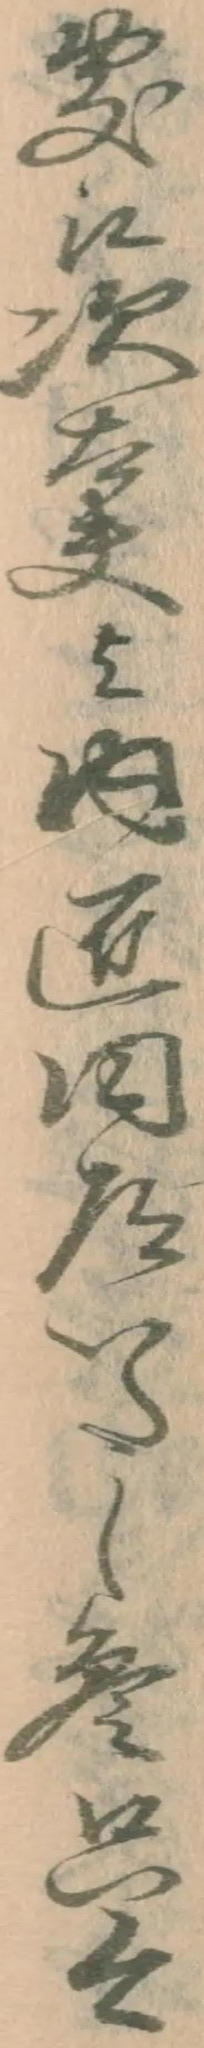處江次太夫与内匠同道いたし参只今
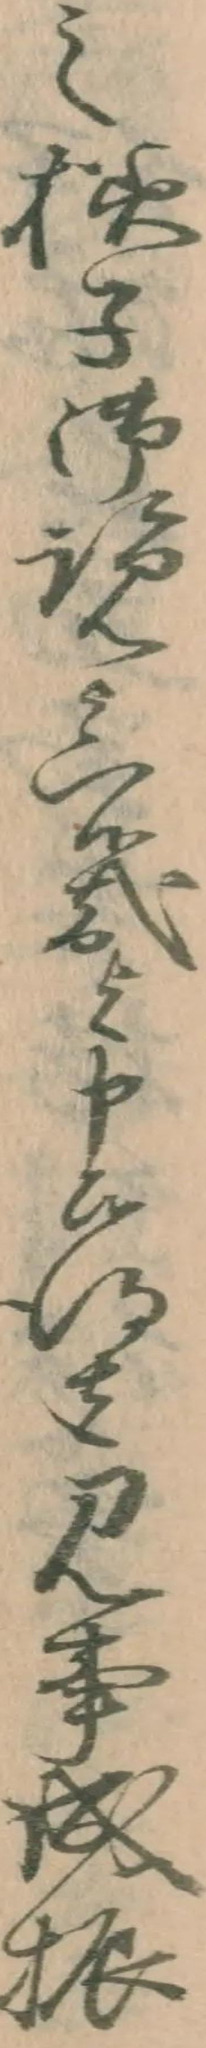之様子御覧迄候哉与申候得者見事成振
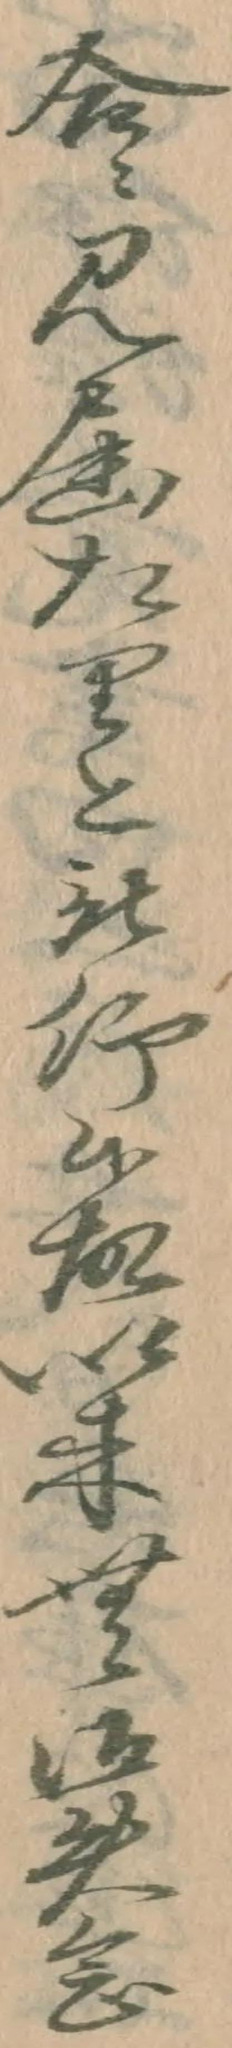合に見届た里と被仰候故以来無御失念
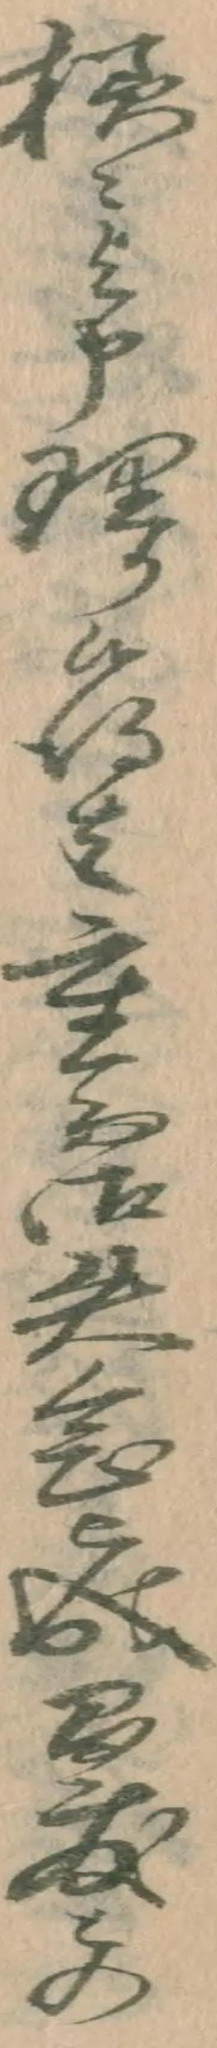様に与申理り候得者重而御失念被成間敷との
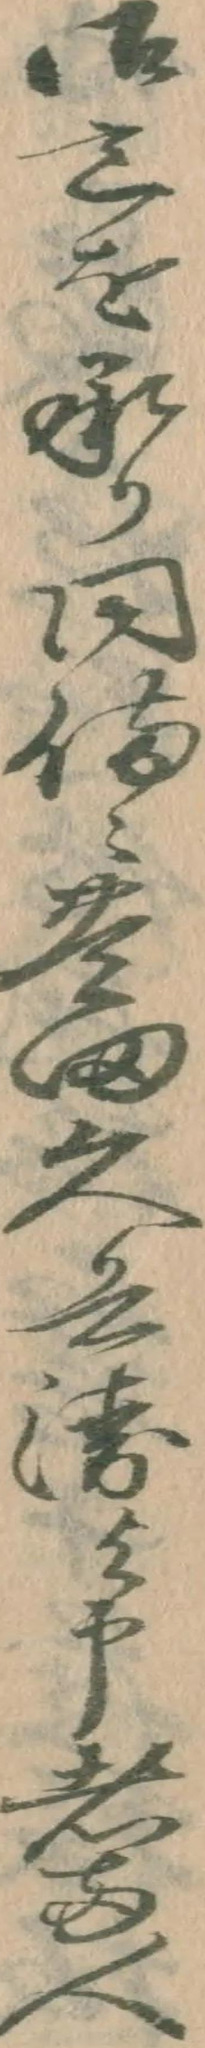御意を承り同備に豊田久兵衛与申者両人
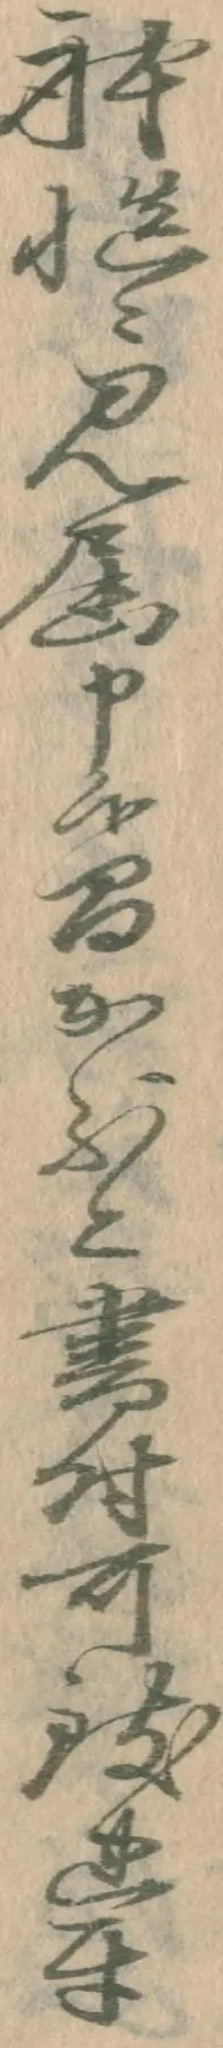躰慥に見届申候間かふと書付可致迚互
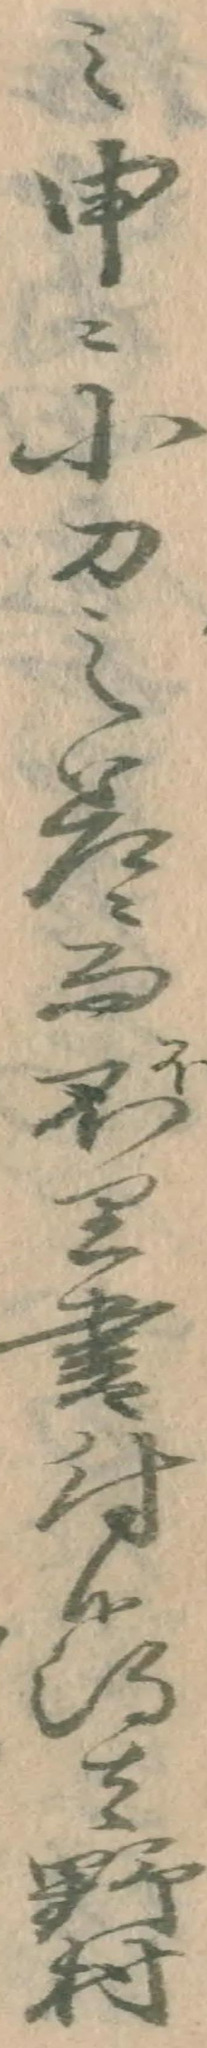之申に小刀之差に而不里書付候得者野村
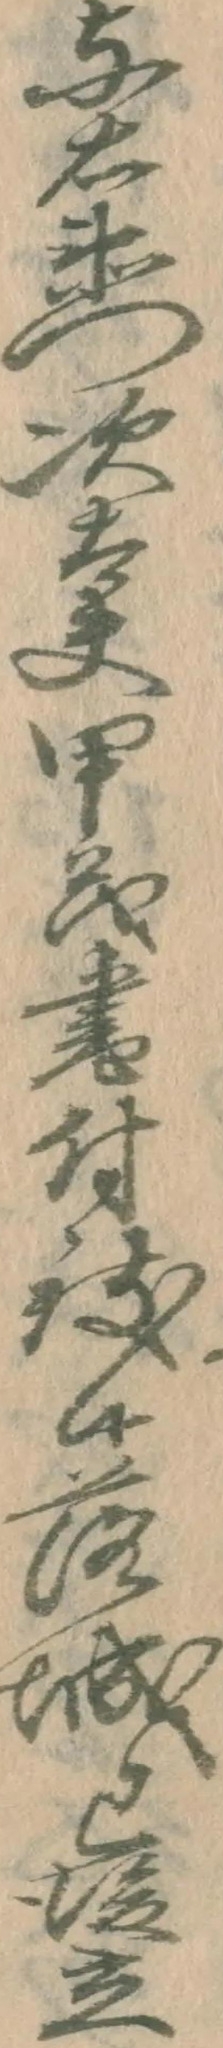与右衛門次太夫甲茂書付致候落城已後立
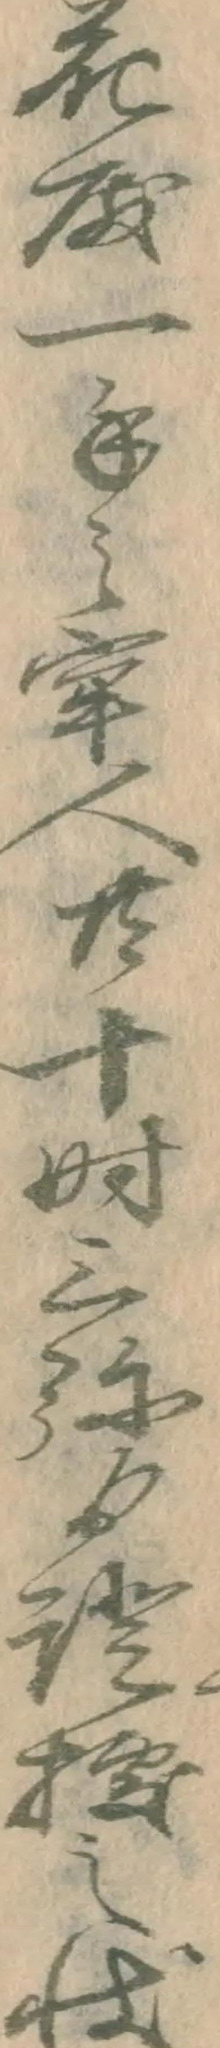花殿一手之牢人共十時三弥ゟ證拠之状
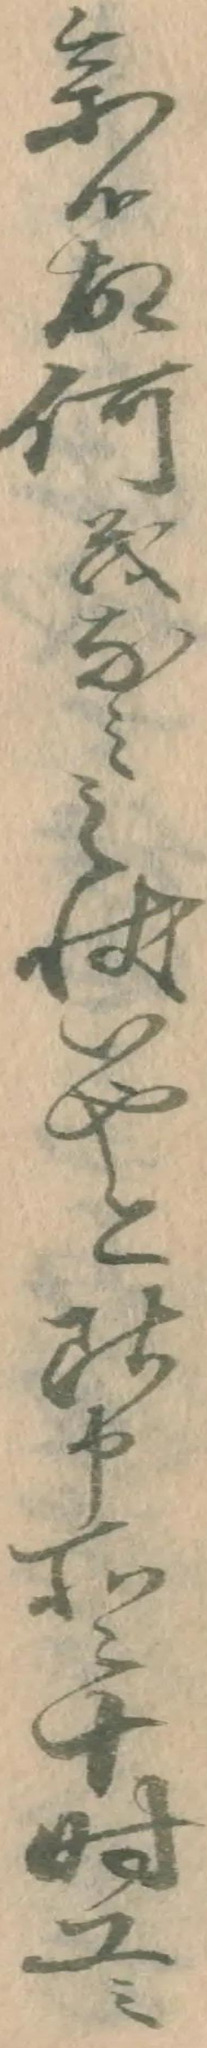参候故何茂なし之状いやと断申所に十時工之

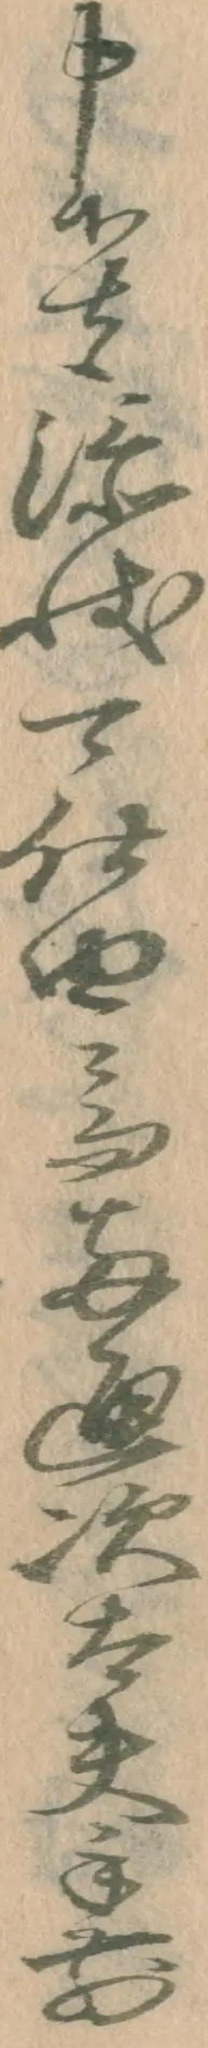申候者添状可仕由に而両通次太夫手前
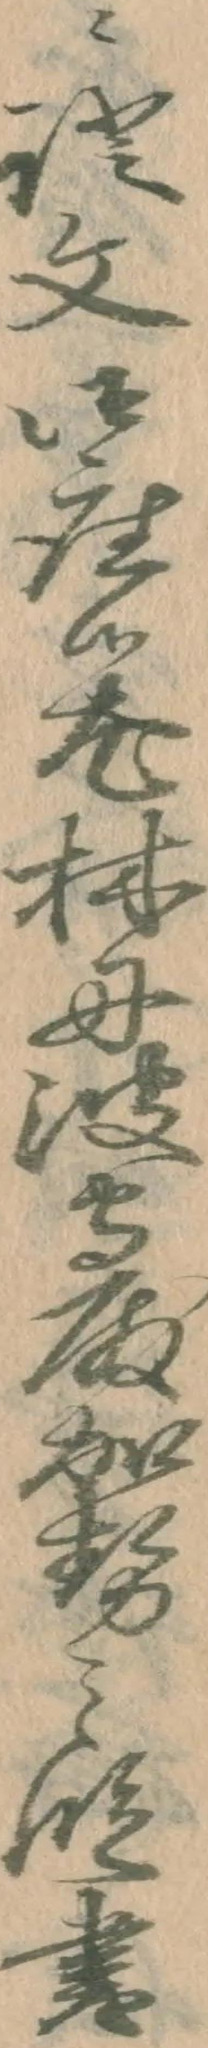に證文御座候尤林丹波守殿加勢之段書
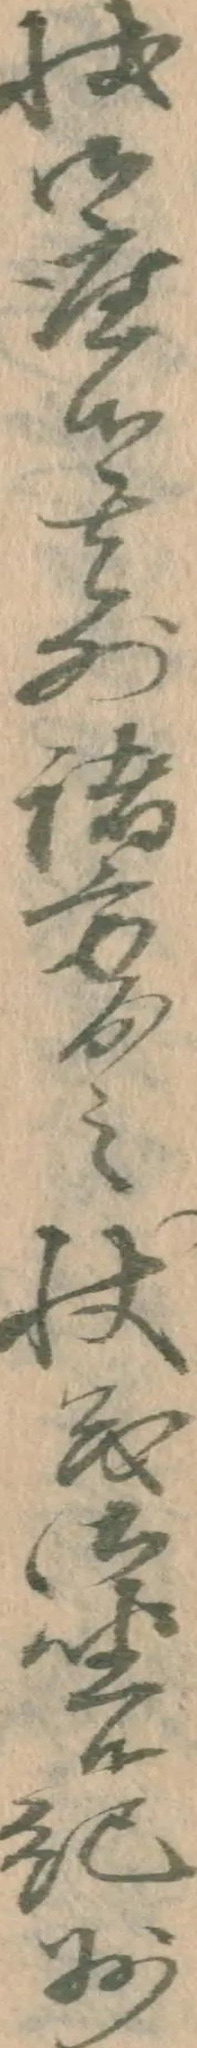状御座候其外諸方ゟ之状茂御坐候紀州
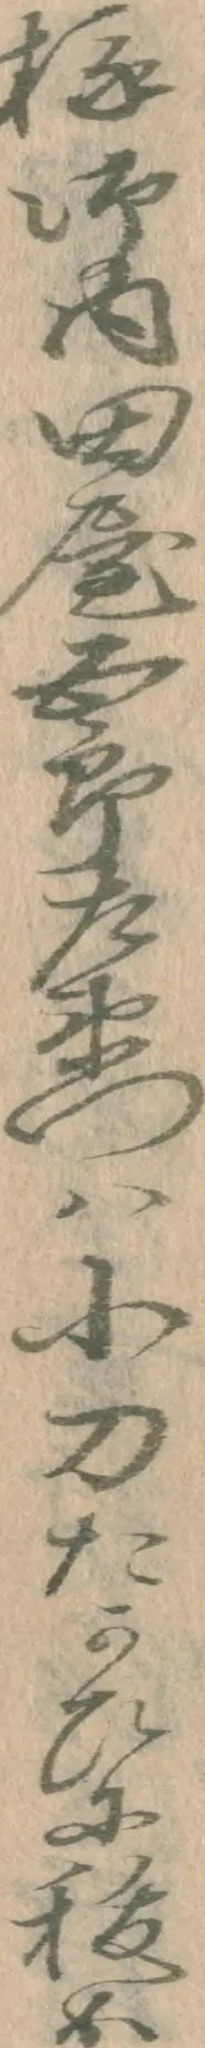様御内田屋五郎左衛門は小刀た可ひ尓抜か
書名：切支丹御退治記 49巻. [8]
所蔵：国立国会図書館 National Diet Library, JAPAN
